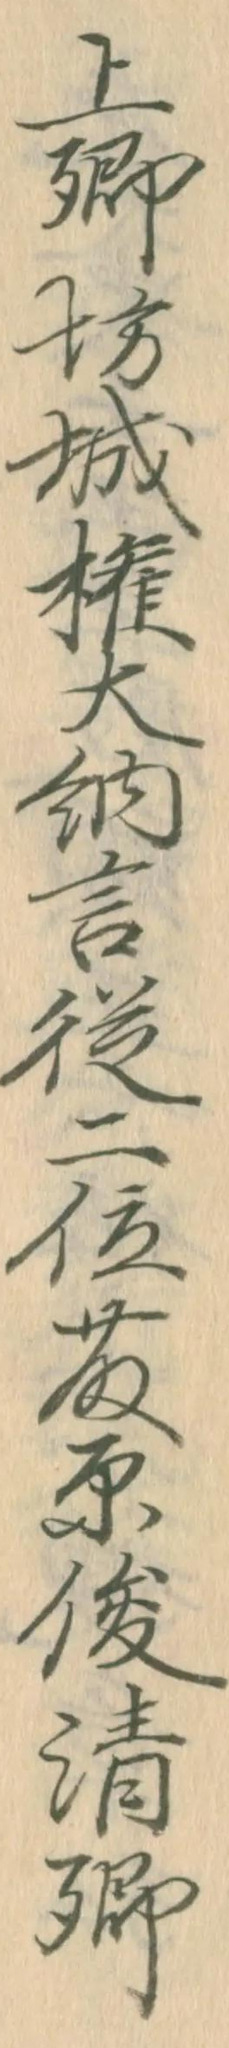上卿坊城権大納言従二位藤原俊清卿
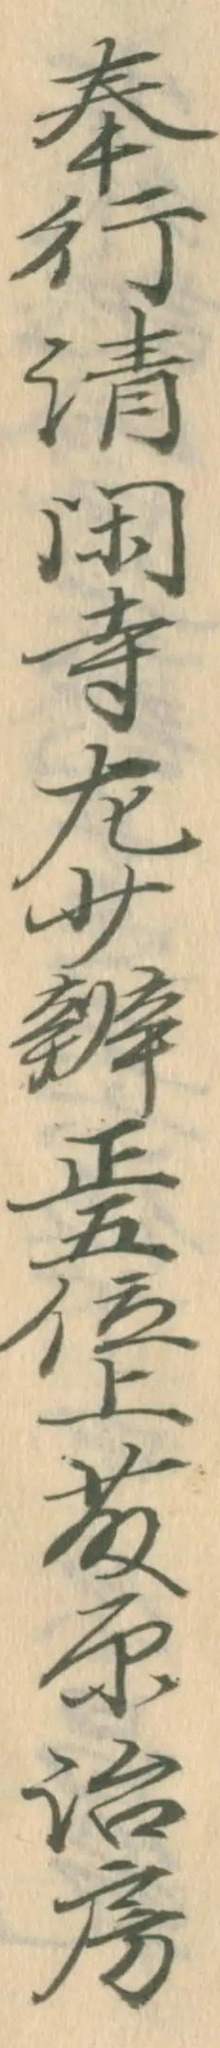奉行清閑寺左少弁正五位上藤原治房
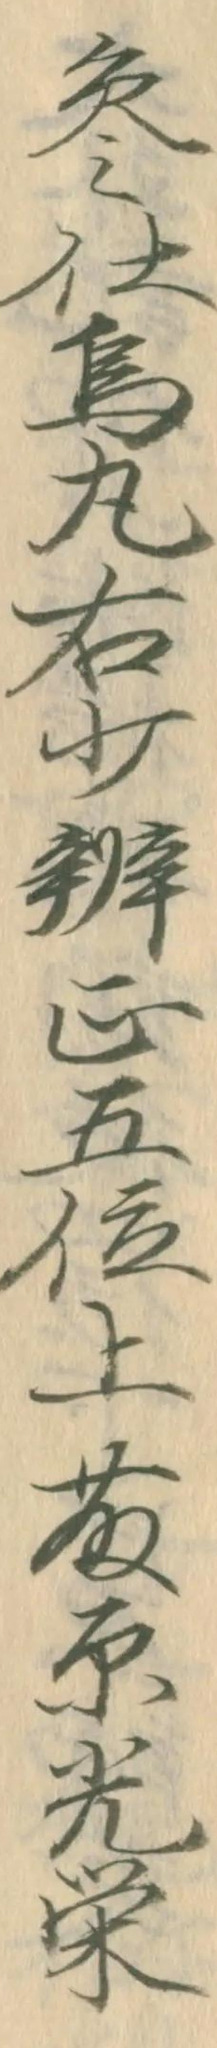参仕烏丸右少弁正五位上藤原光栄

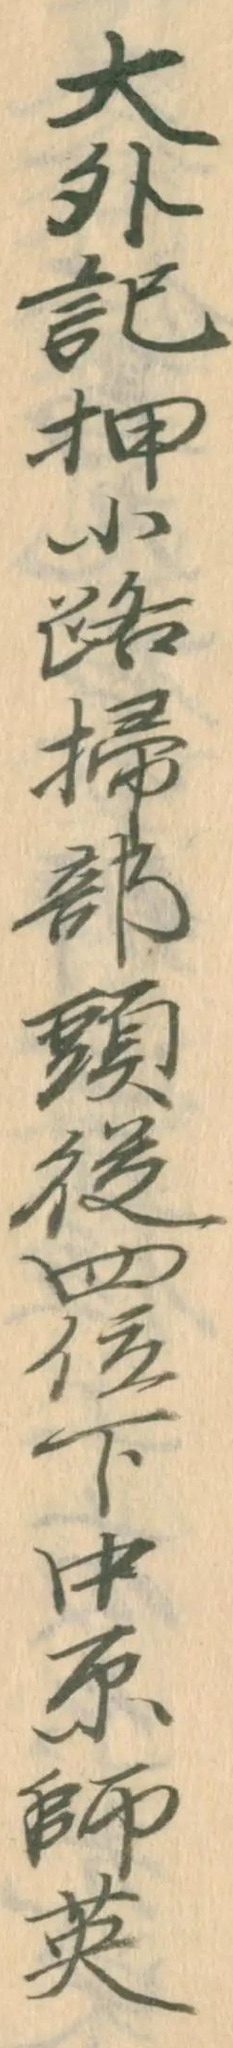大外記押小路掃部頭従四位下中原師英
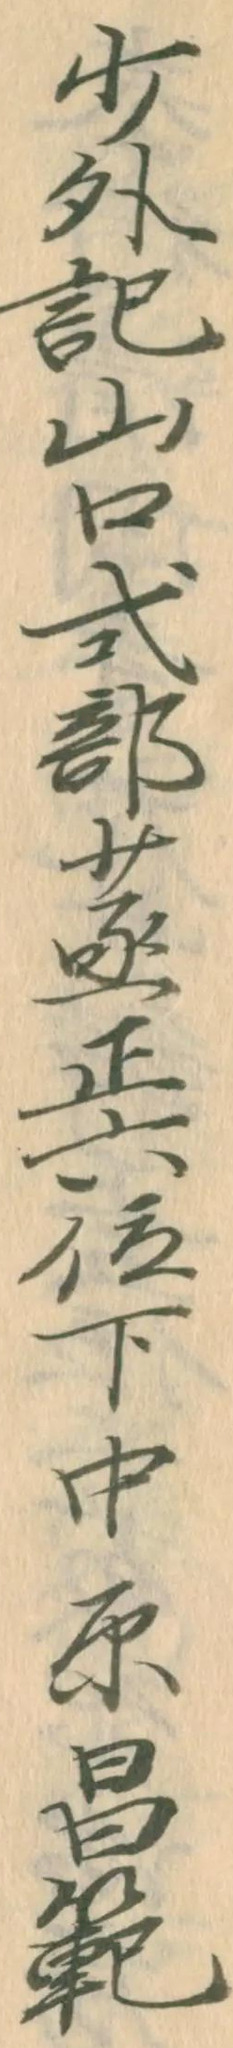少外記山口式部少丞正六位下中原昌範
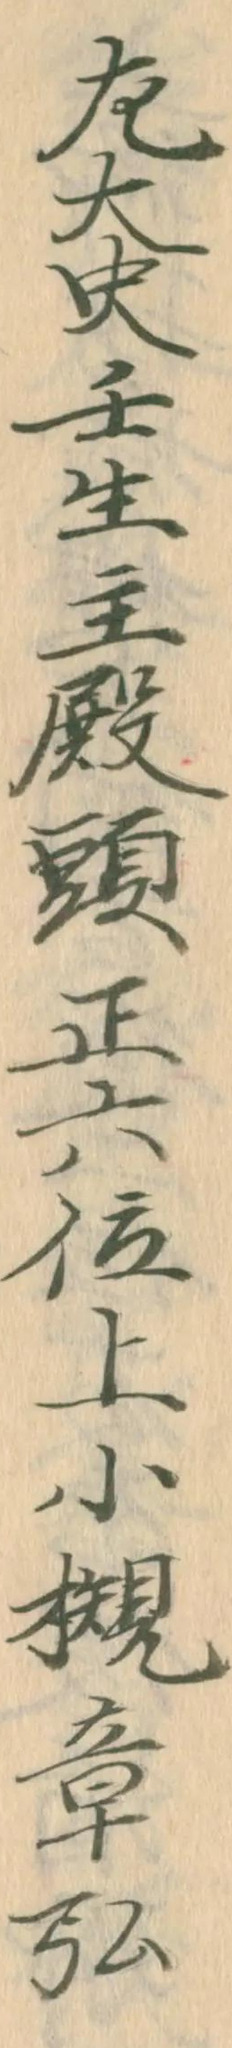左大史壬生主殿頭正六位上小槻章弘
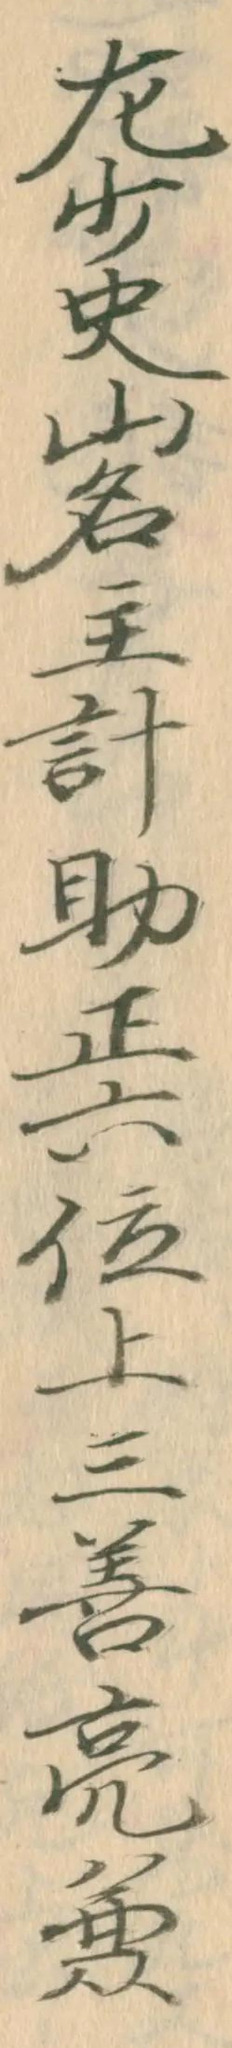左少史山名主計助正六位上三善亮兼
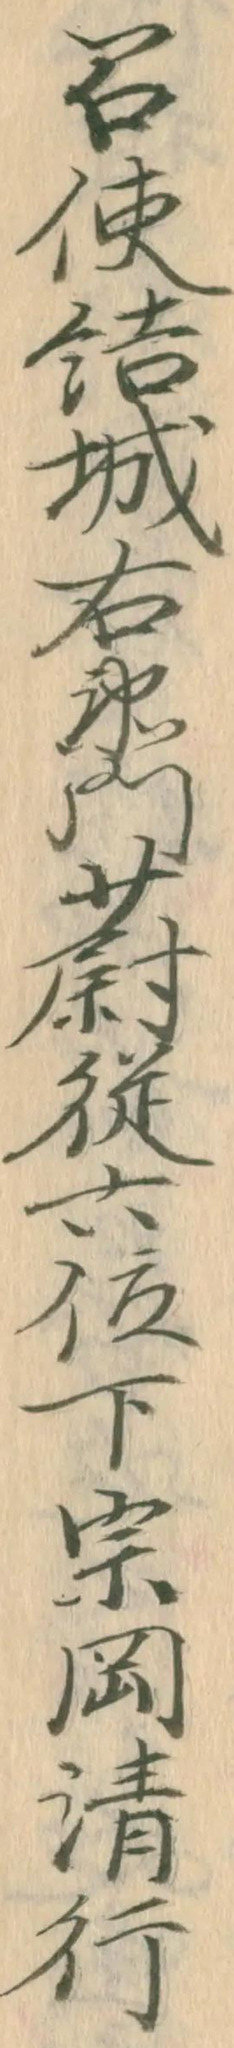召使結城右衛門少尉従六位下宗岡清行
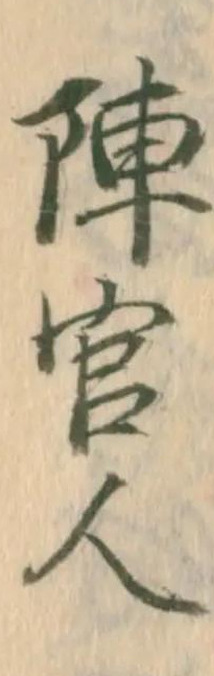陣官人
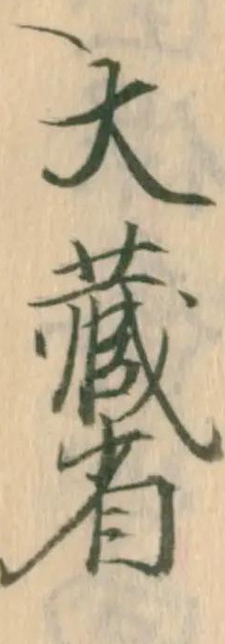大蔵省
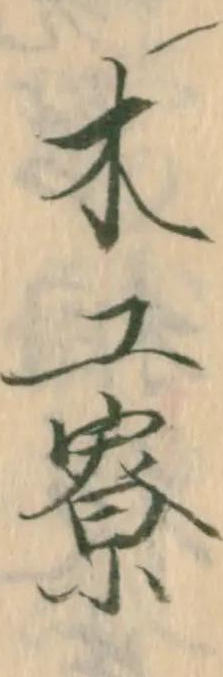木工寮
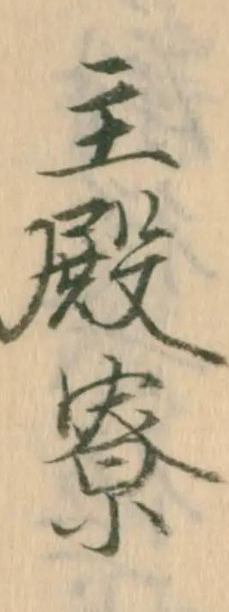主殿寮
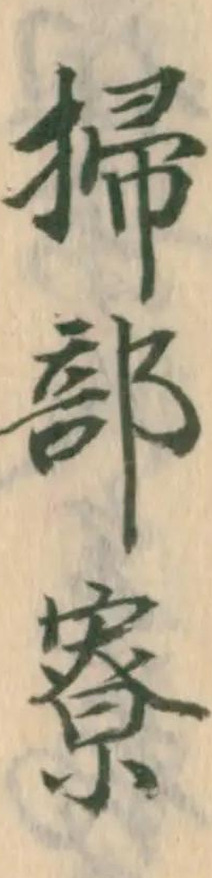掃部寮
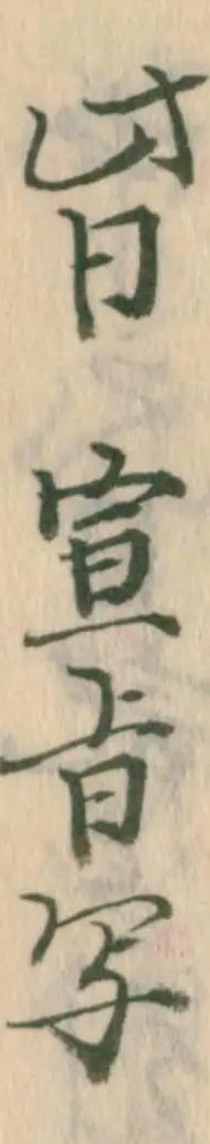此日宣旨写
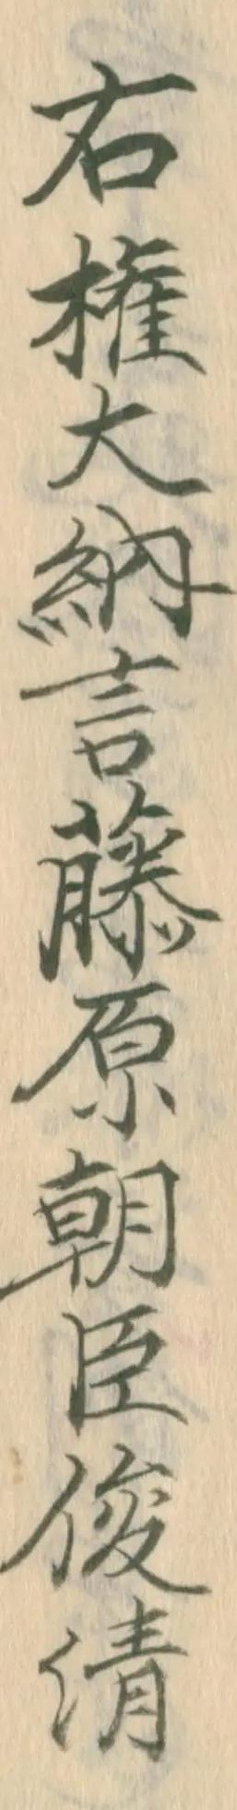右権大納言藤原朝臣俊清

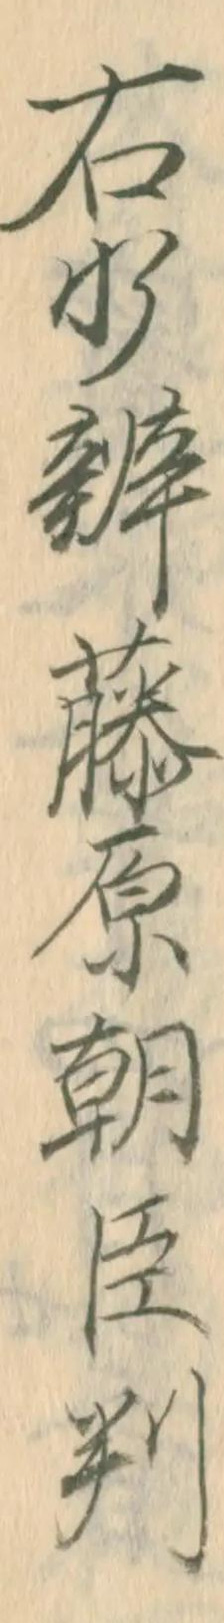右少弁藤原朝臣判
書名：賀茂社記録. 第15冊
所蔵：国立国会図書館 National Diet Library, JAPAN
